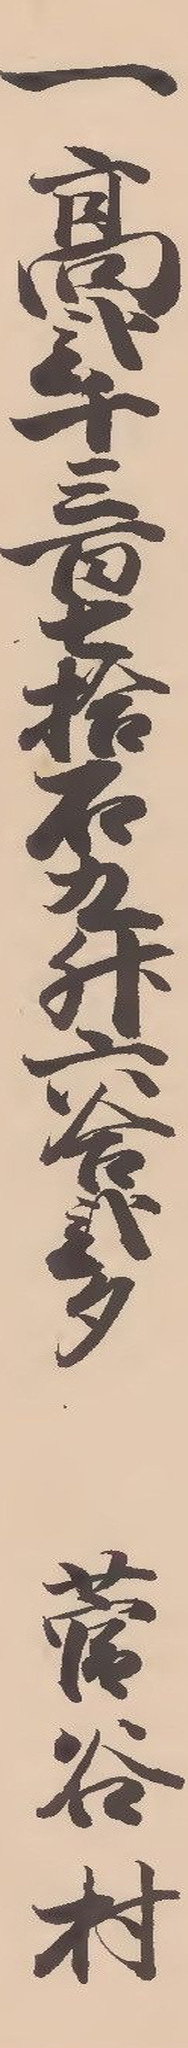一高弐千三百七拾石九升六合弐勺菅谷村
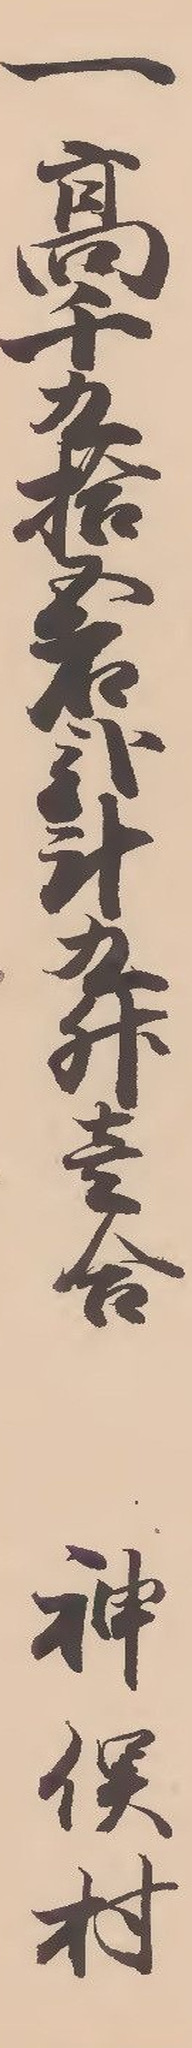一高千九拾五石弐斗九升壱合神俣村

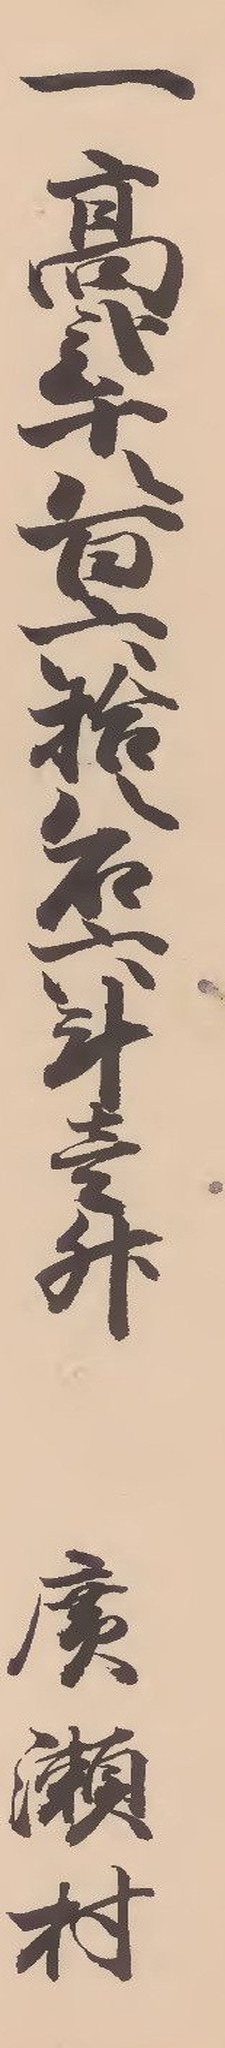一高弐千八百六拾八石六斗壱升広瀬村
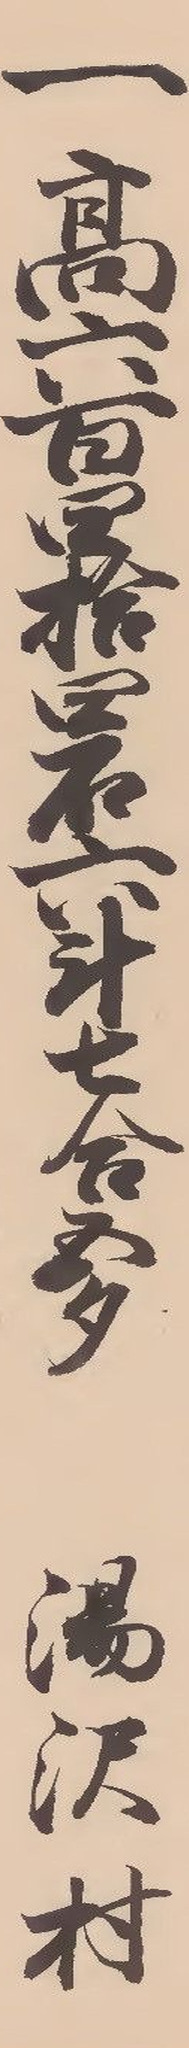一高六百四拾四石六斗六七合五勺湯沢村
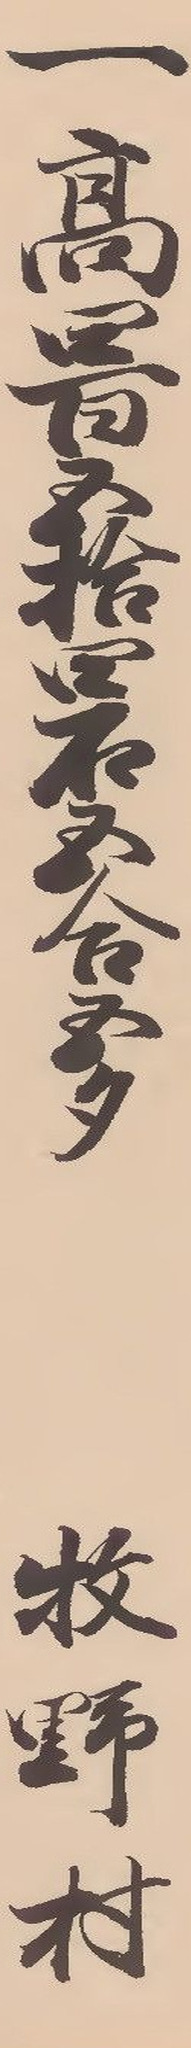一高四百五拾四石五合五勺枚野村
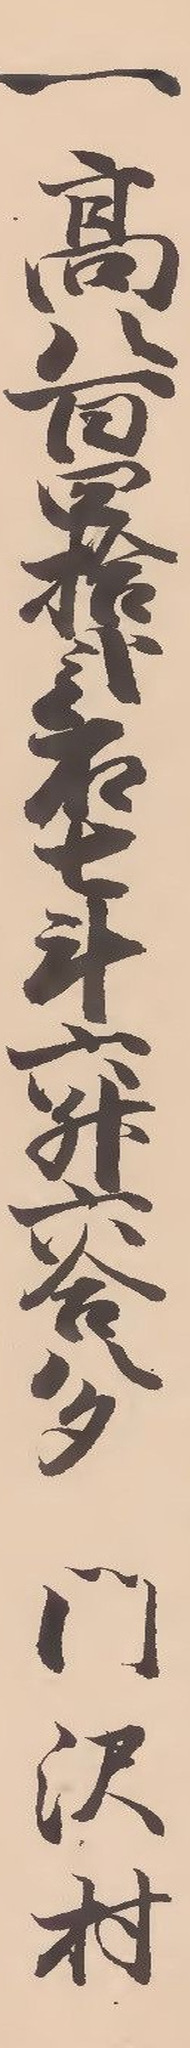一高八百四拾弐石七斗六升六合八勺門沢村
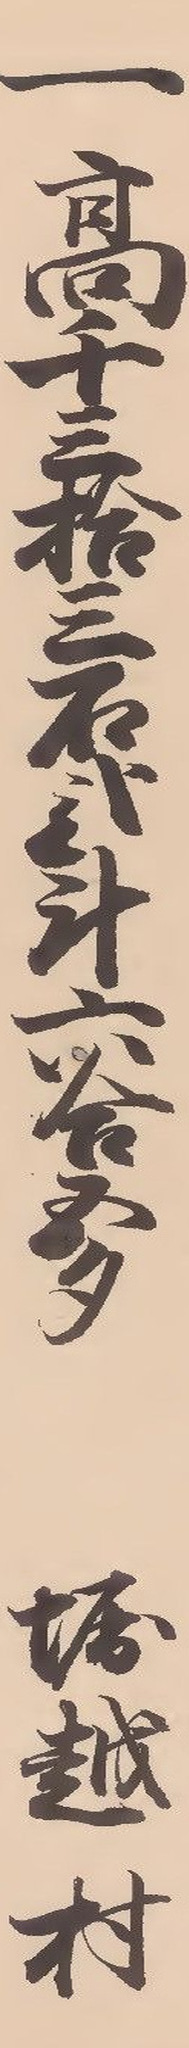一高千三拾三石弐斗六合五勺堀越村
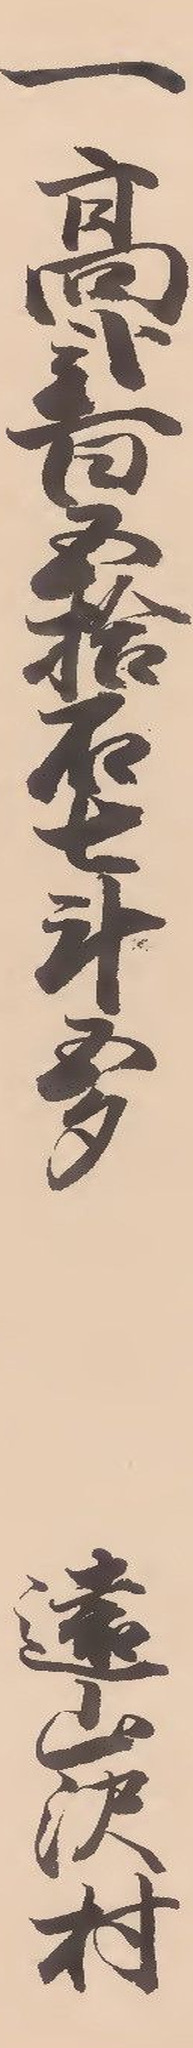一高弐百五拾石七斗五勺遠山沢村
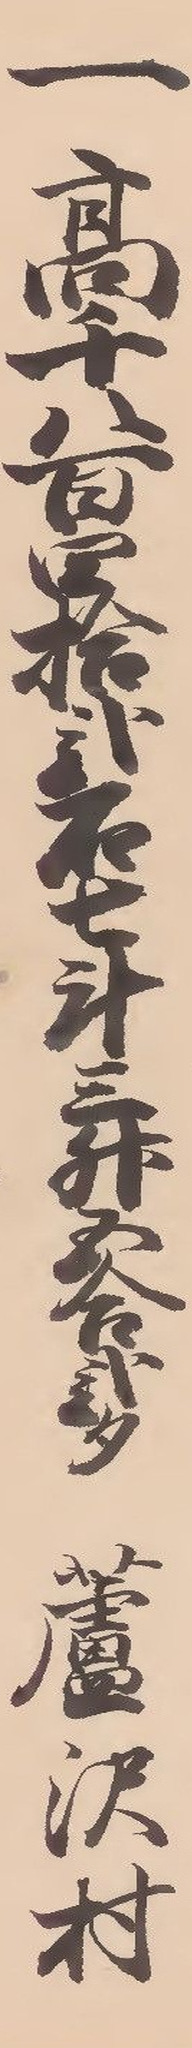一高千八百四拾弐石七斗三升五合弐勺蘆沢村

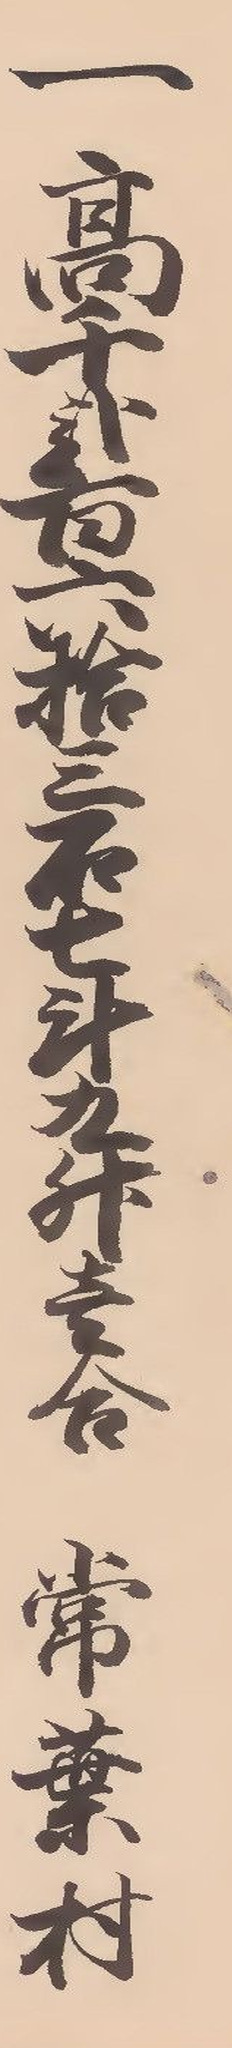一高千弐百六拾三石七斗九升壱合常葉村
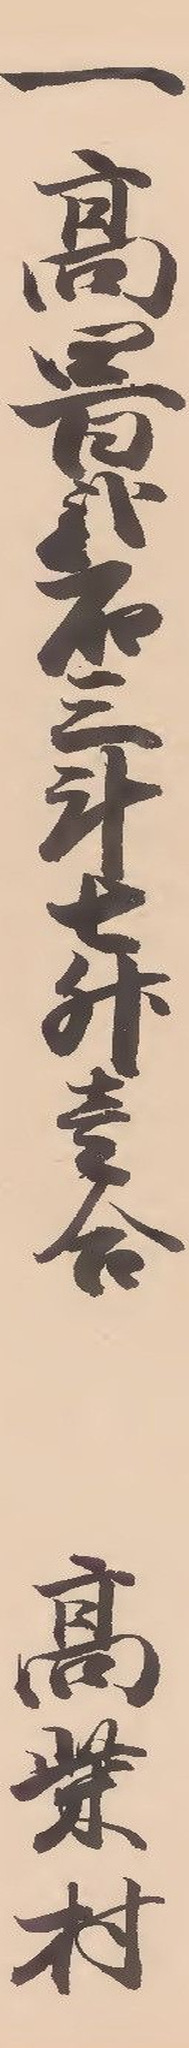一高四百弐石三斗七升壱合高柴村
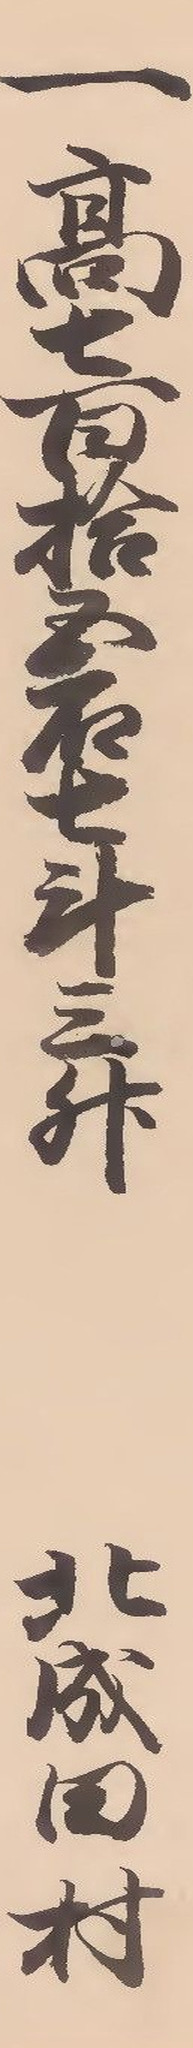一高七百拾五石七斗三升北成田村
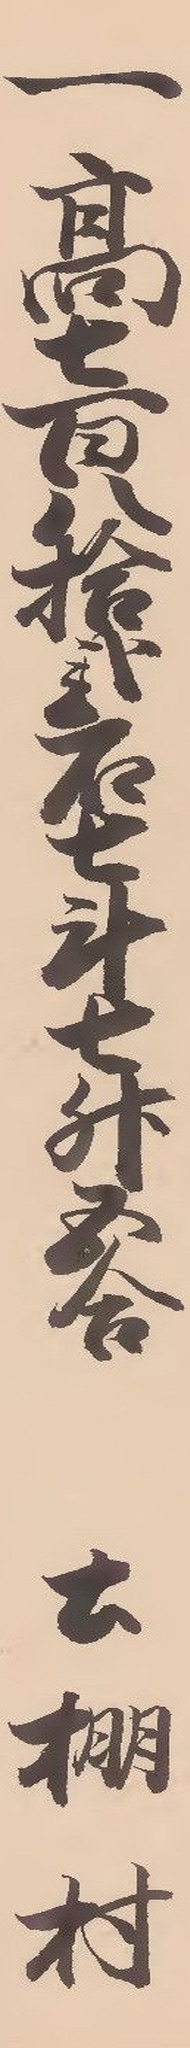一高七百八拾弐石七斗七升五合土棚村
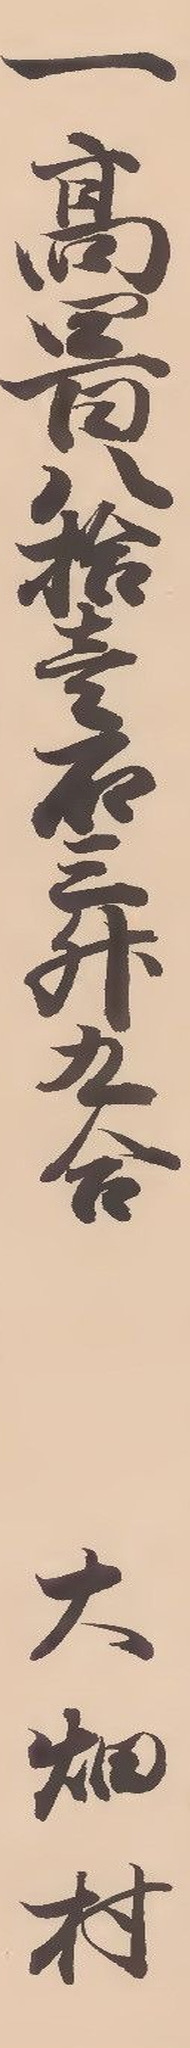一高四百八拾壱石三升九合大畑村
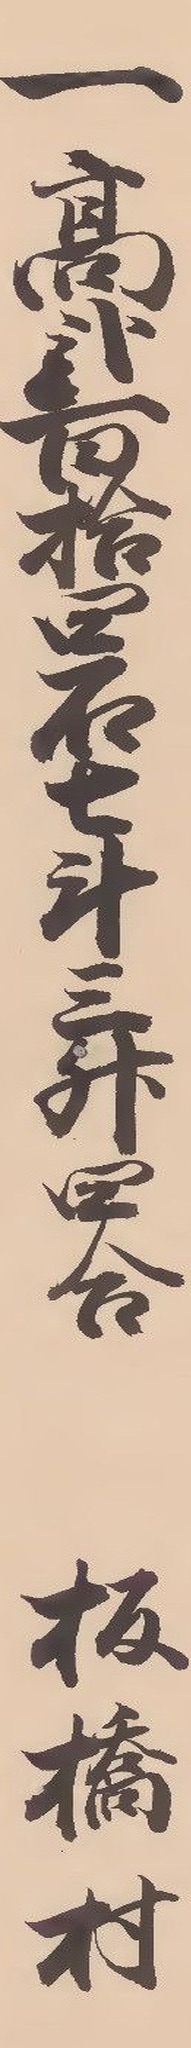一高弐百拾四石七斗三升四合板橋村
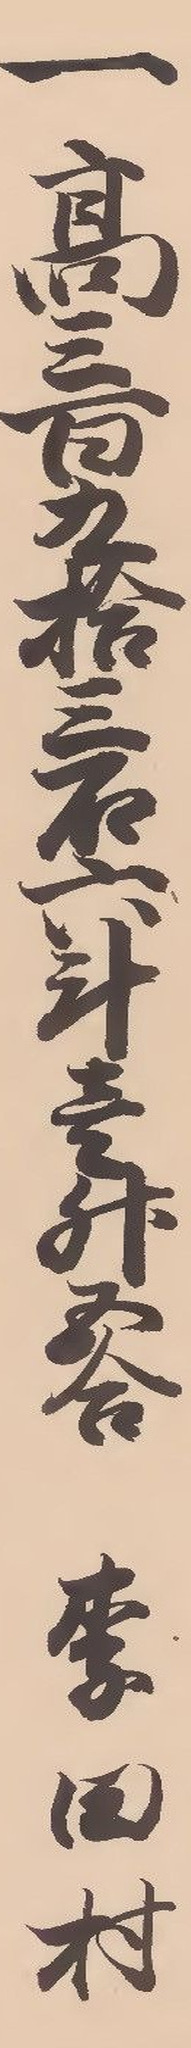一高三百九拾三石六斗壱升五合李田村
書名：陸奥国郷帳　２
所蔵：国立公文書館 National Archives of Japan
